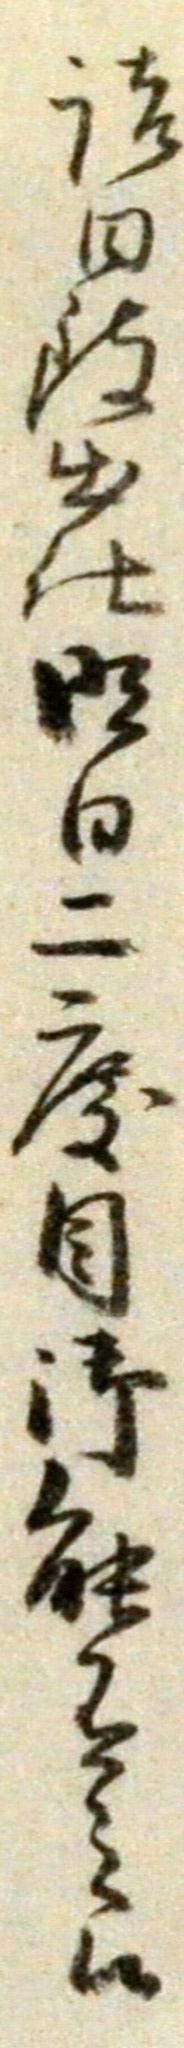詰日致出仕明日二度目御能有之候
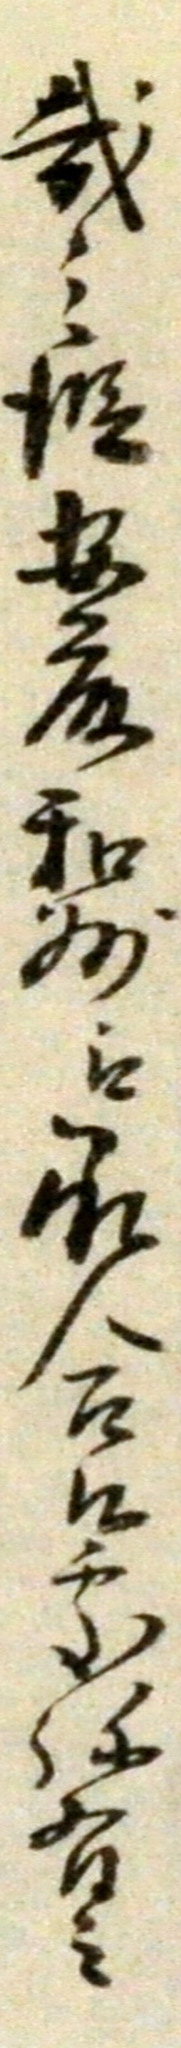哉之段安藤和州え承合候處弥有之
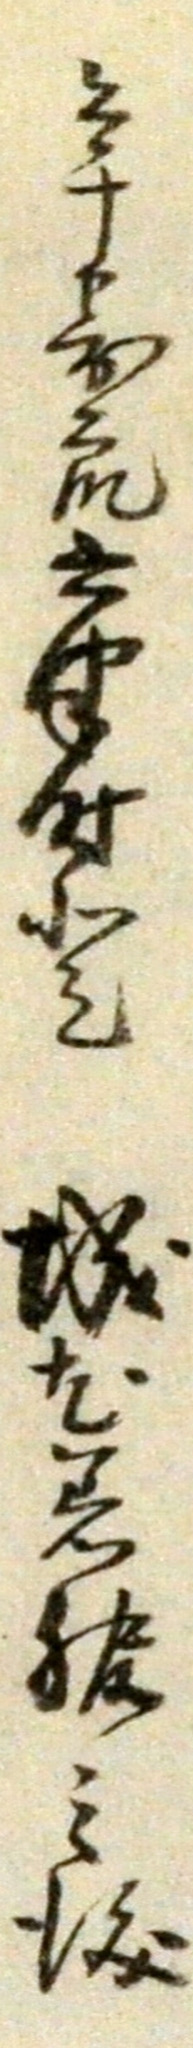年寄衆六半時登城尤着服之儀
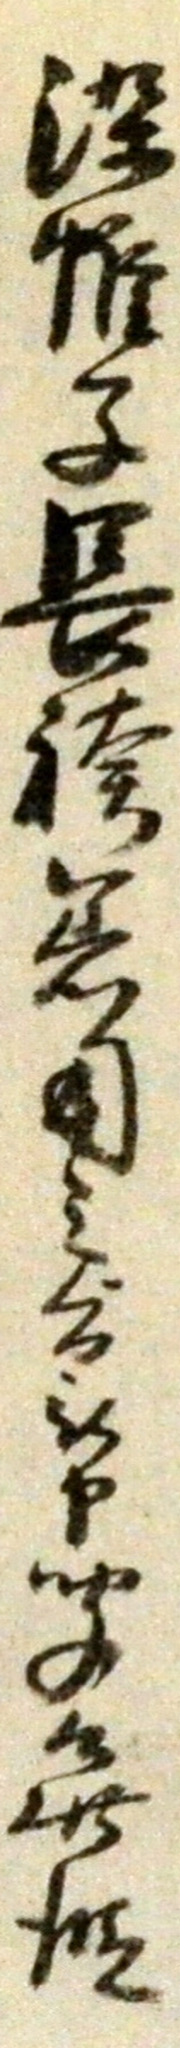染帷子長袴着用之旨被申聞候此段
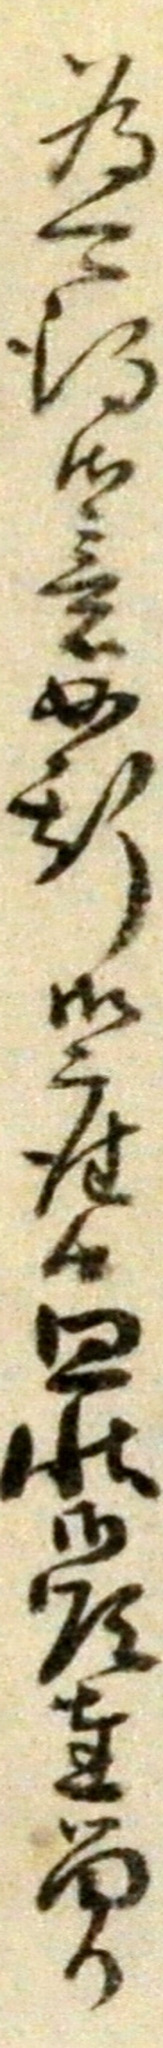為可得御意如斯御座候廻状御順達留り
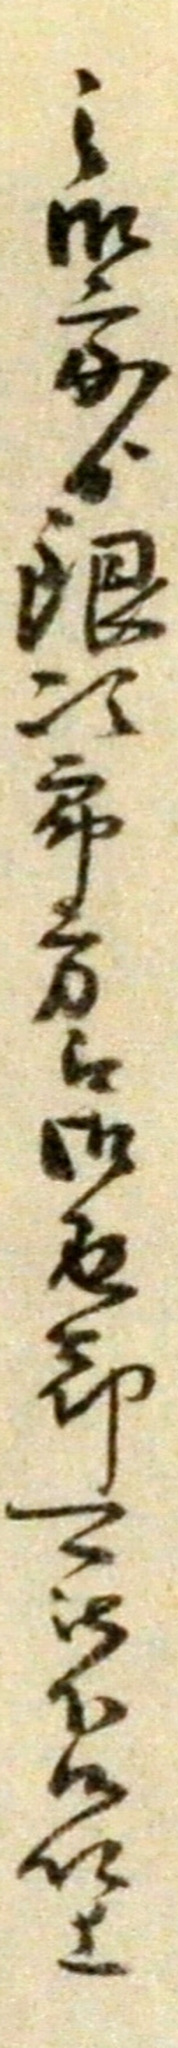之御方ゟ銀次郎方え御返却可被下候以上
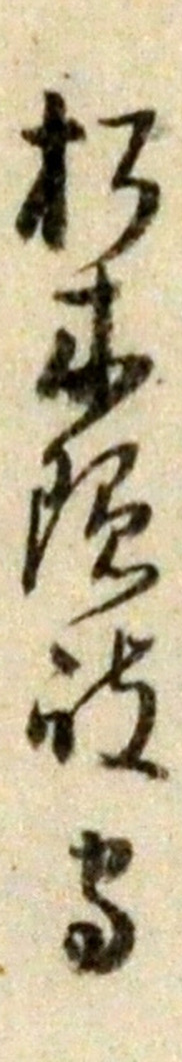朽木隠岐守
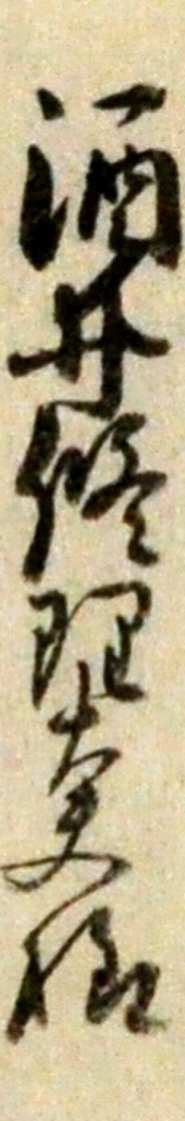酒井修理大夫様
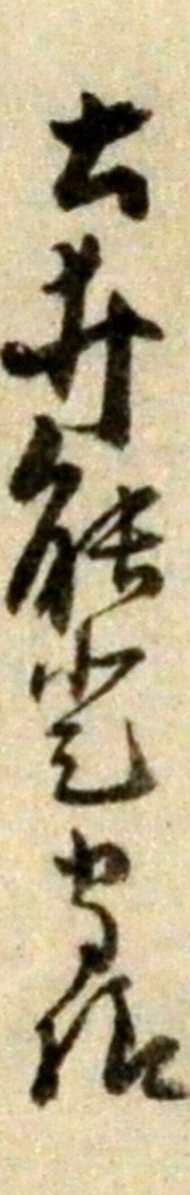土井能登守様
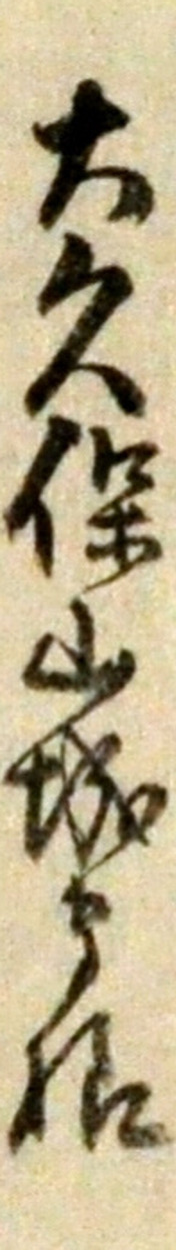大久保山城守様
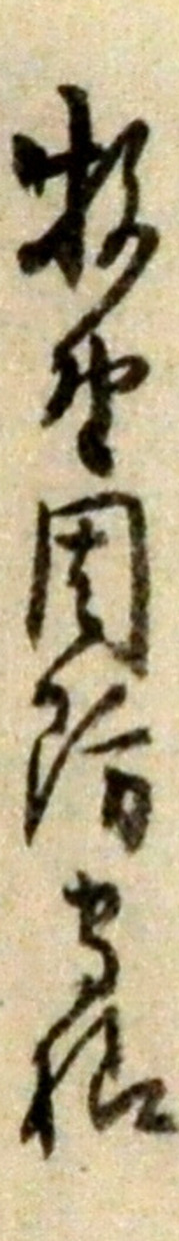牧野周防守様
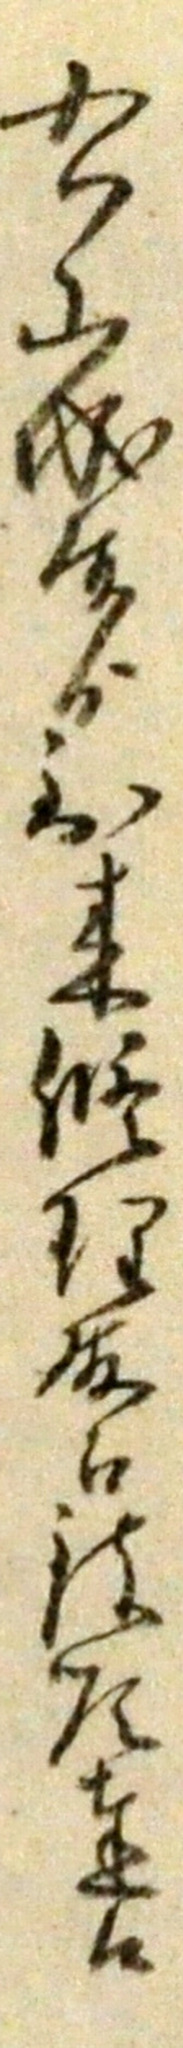右山城殿ゟ到来修理殿え致順達候
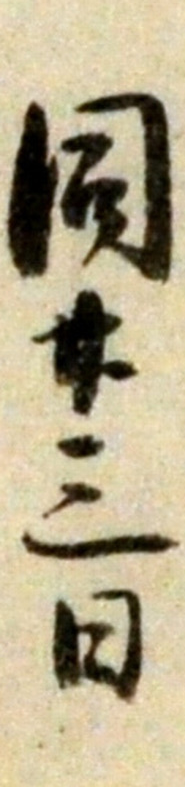同廿三日
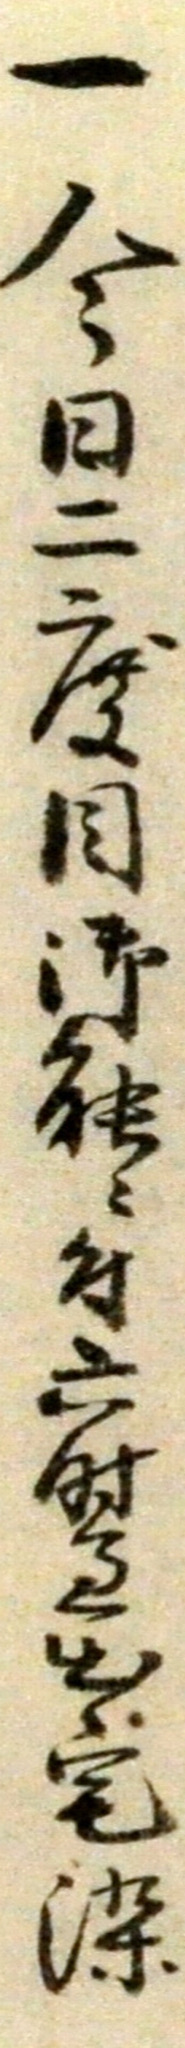一今日二度目御能ニ付六時過出宅染
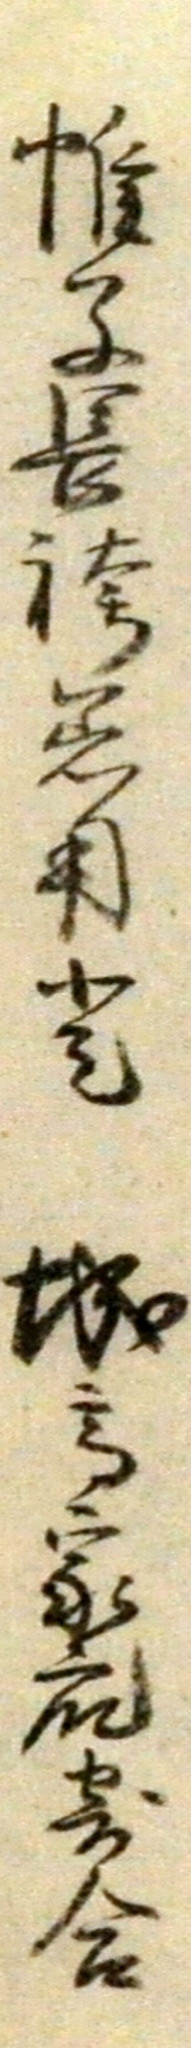帷子長袴着用登城高家衆寄合
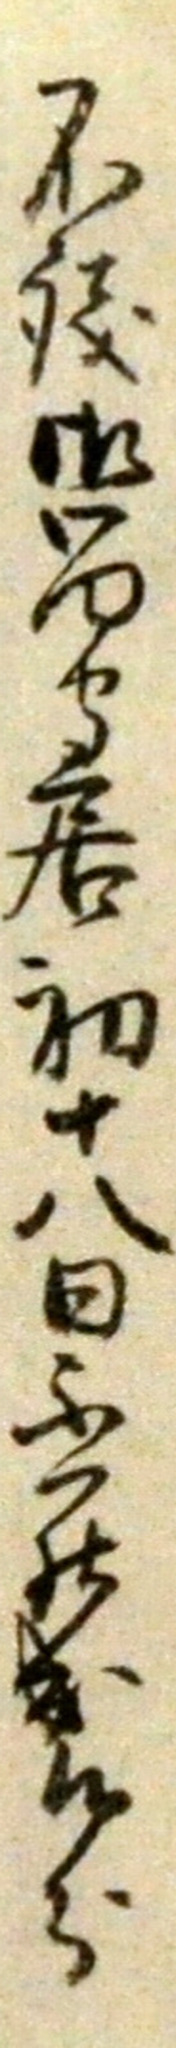不残御留守居初十八日不罷出候分
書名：若君様（家斉嫡男）誕生諸祝儀ノ節ノ留書外
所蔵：伊那市立高遠町図書館・合同会社AMANE
